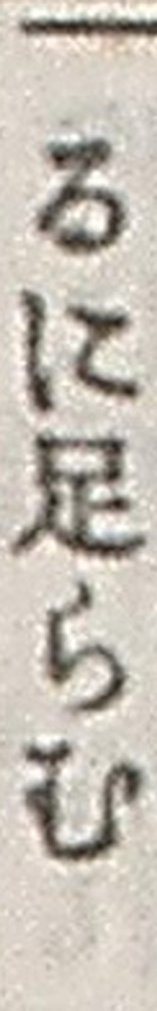るに足らむ
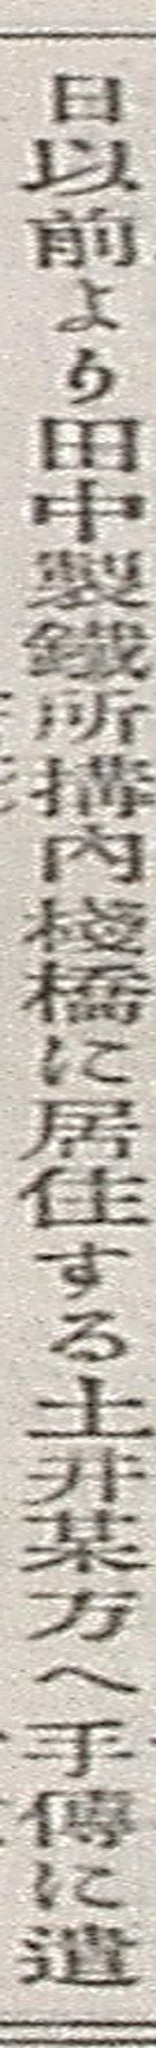日以前より田中製鉄所構内桟橋に居住する土井某方へ手伝に遣
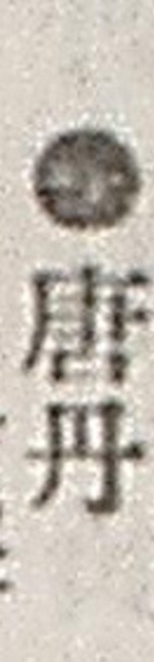●唐丹
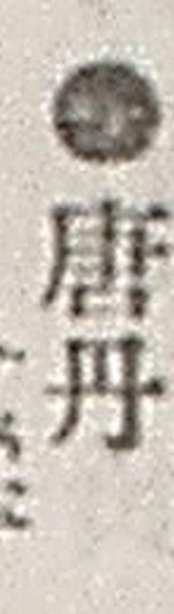●唐丹
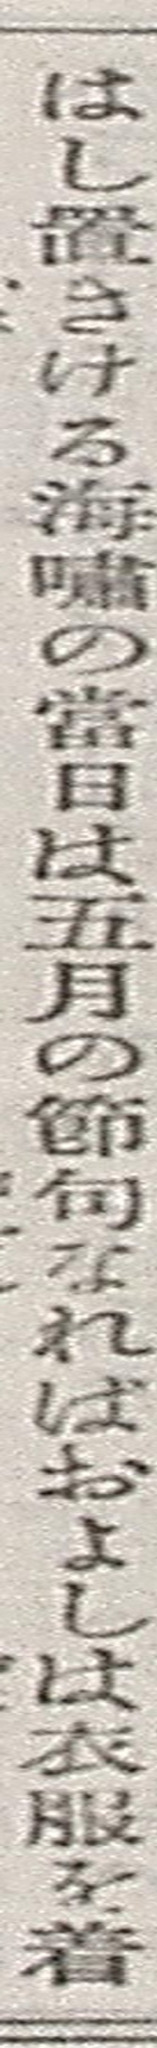はし置きける海嘯の当日は五月の節句なればおよしは衣服を着
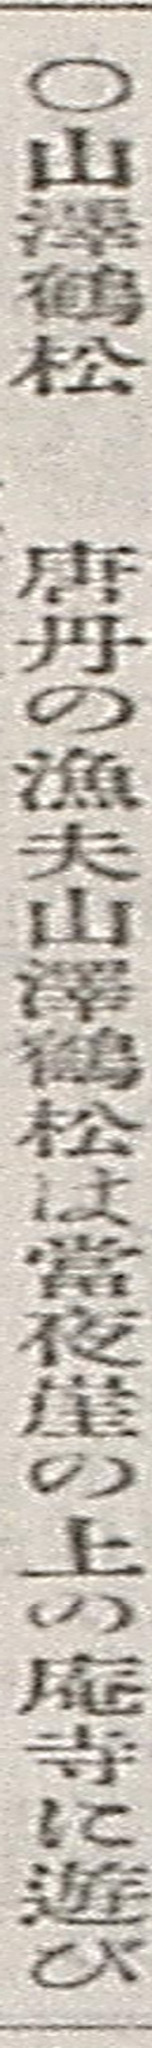○山沢鶴松唐丹の漁夫山沢鶴松は当夜崖の上の庵寺に遊び
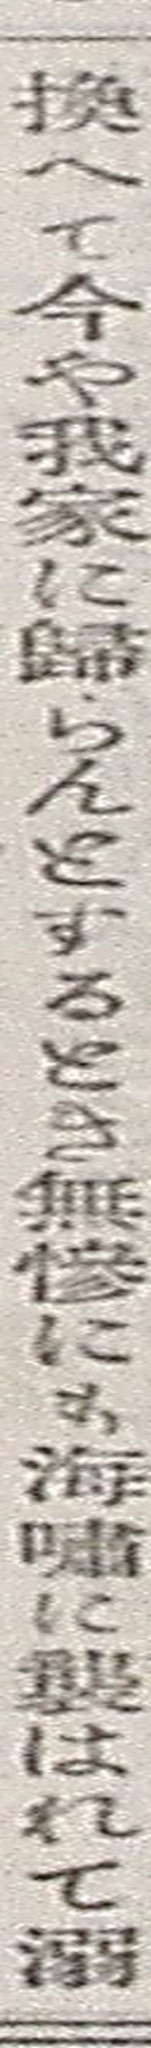換へて今や我家に帰らんとするとき無惨にも海嘯に襲はれて溺
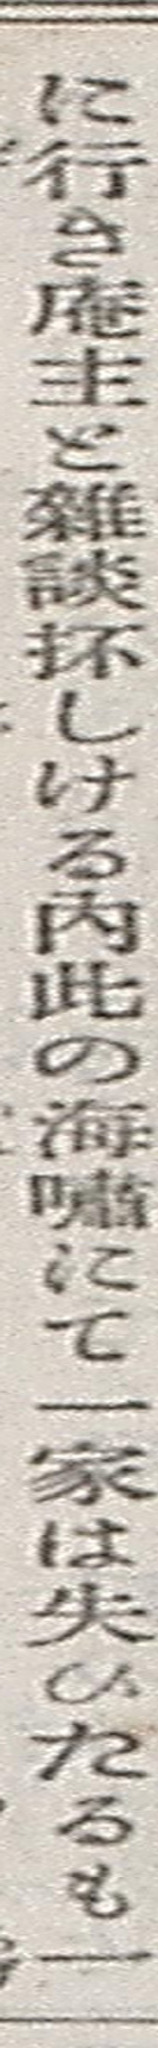に行き庵主と雑談抔しける内此の海嘯にて一家は失ひたるも一
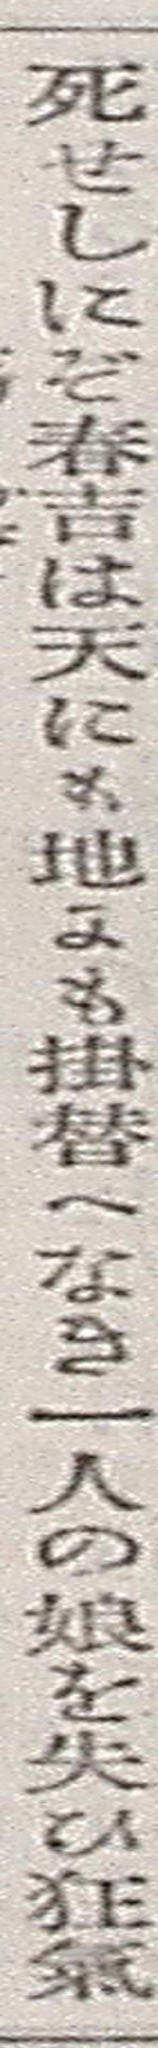死せしにぞ春吉は天にも地にも掛替へなき一人の娘を失ひ狂気
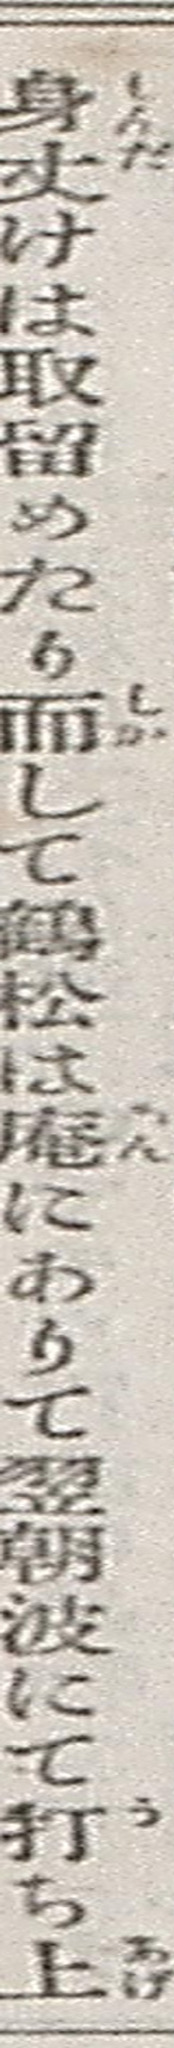身丈けは取留めたり而して鶴松は庵にありて翌朝波にて打ち上
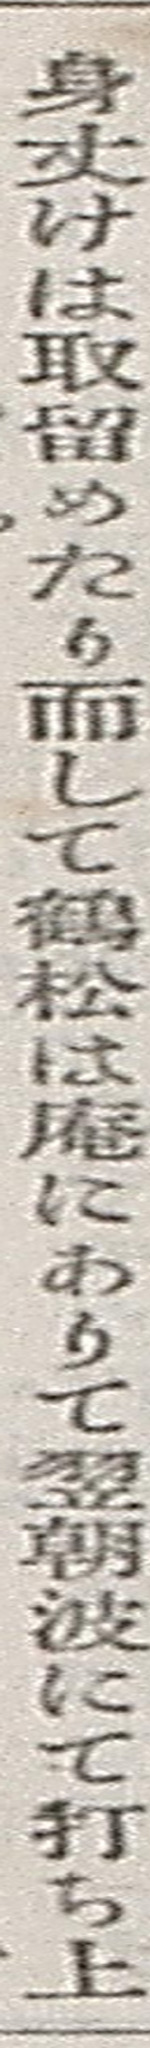身丈けは取留めたり而して鶴松は庵にありて翌朝波にて打ち上
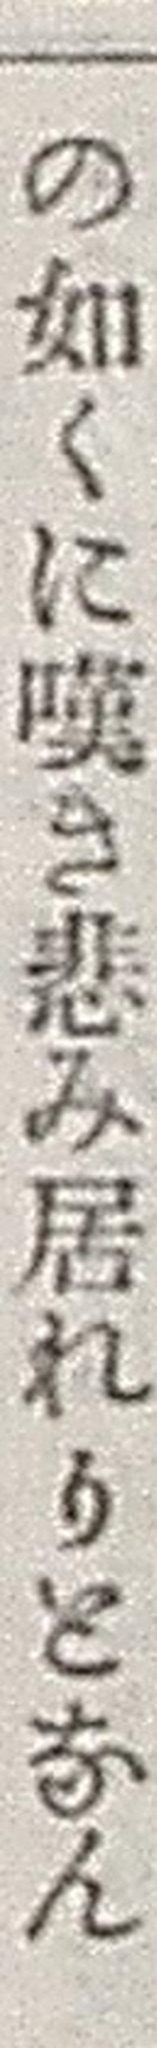の如くに嘆き悲み居れりとなん
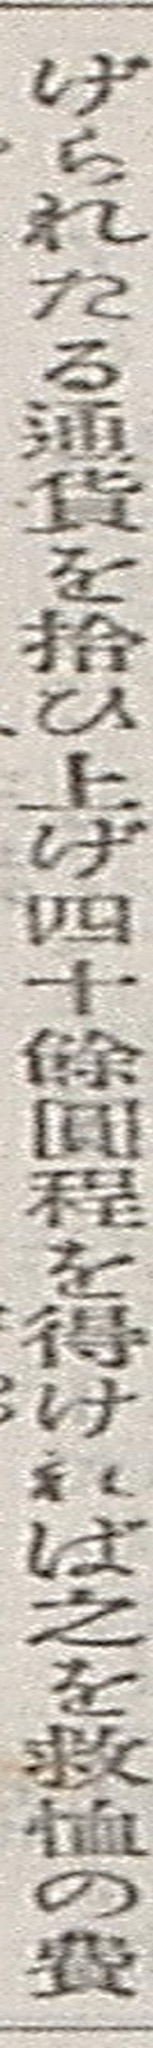げられたる通貨を拾ひ上げ四十余円程を得ければ之を救恤の費
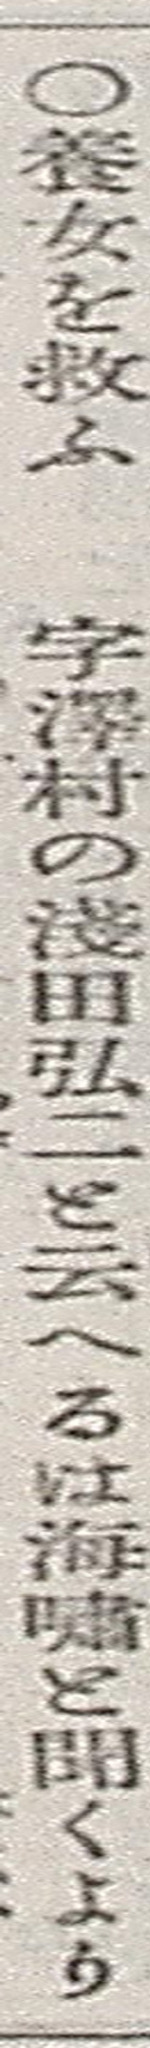○養女を救ふ字沢村の浅田弘二と云へるは海嘯と聞くより
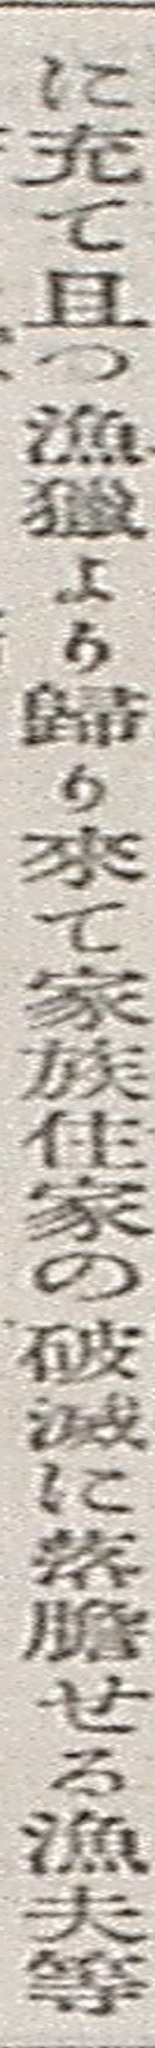に充て且つ漁猟より帰り来て家族住家の破滅に落胆せる漁夫等
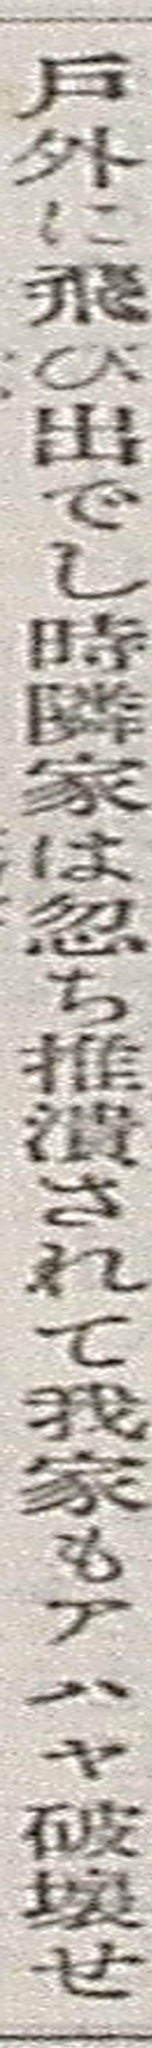戸外に飛び出でし時隣家は忽ち推潰されて我家もアハヤ破壊せ
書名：風俗畫報臨時増刊第百二十號　大海嘯被害録（下）
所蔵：東京大学地震研究所図書室 Earthquake Research Institute Library, The University of Tokyo, JAPAN
